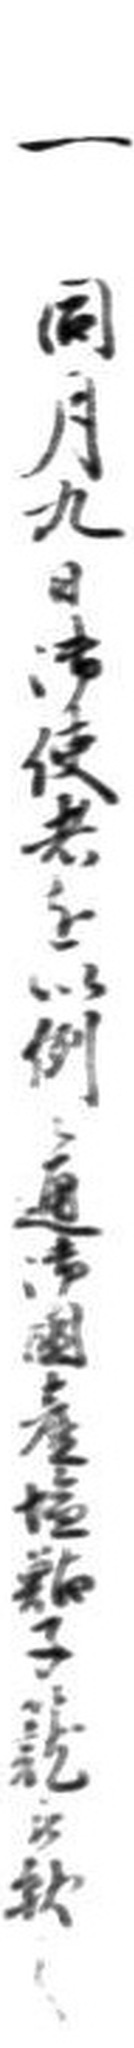一同月九日御使者を以例之通御国産塩鮎子籠被献之
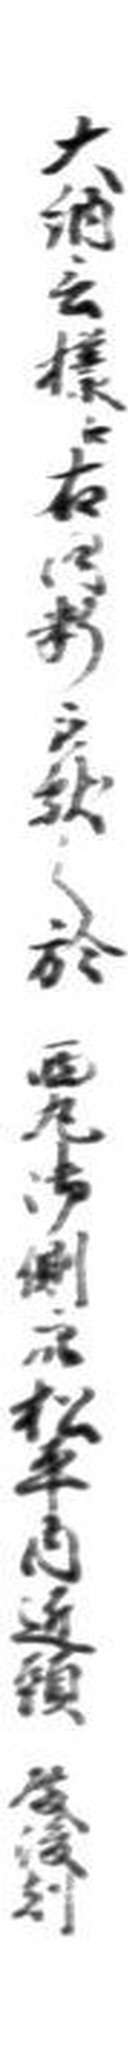大納言様江右同断被献之於西丸御側衆松平内匠頭殿後刻
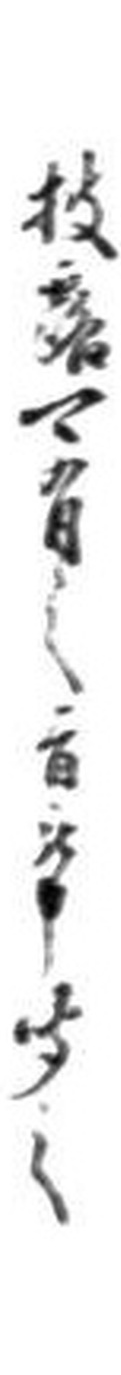披露可有之旨被申聞之
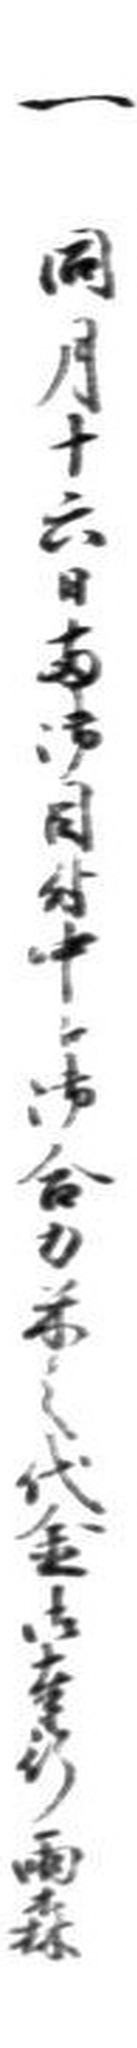一同月十六日両御目付中江御合力米之代金御奉行雨森
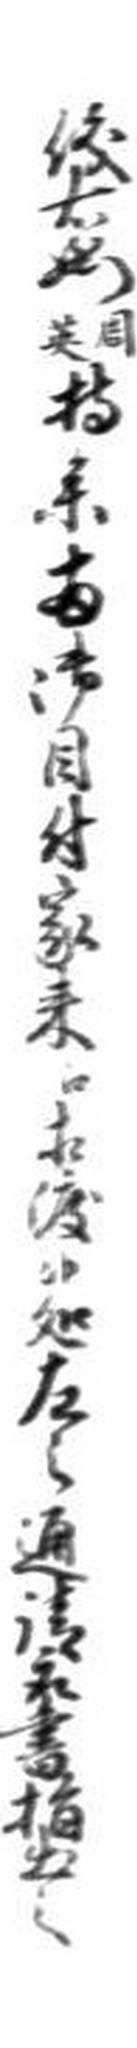儀右衛門周英持参両御目付家来江相渡候処左之通請取書指出之

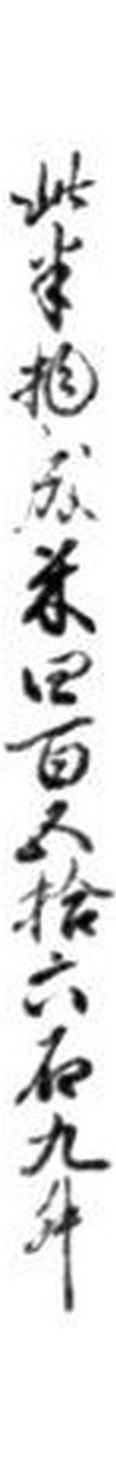此半物成米四百五拾六石九升
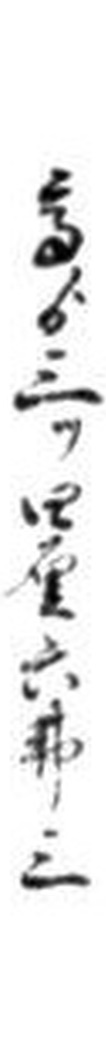高ゟ三ツ四厘六弗三
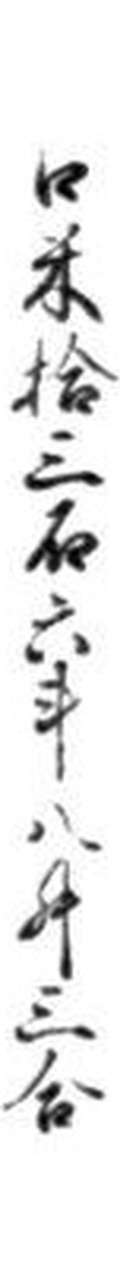口米拾三石六斗八升三合
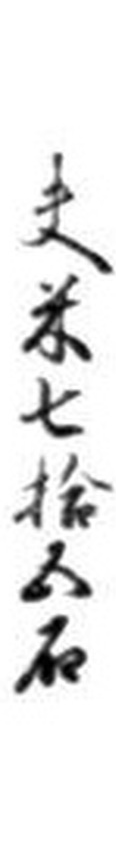夫米七拾五石
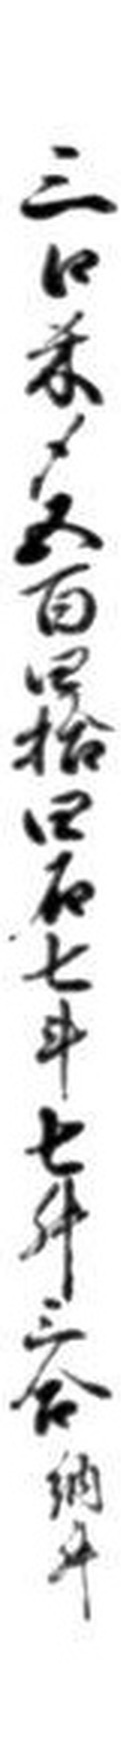三口米〆五百四拾四石七斗七升三合納升
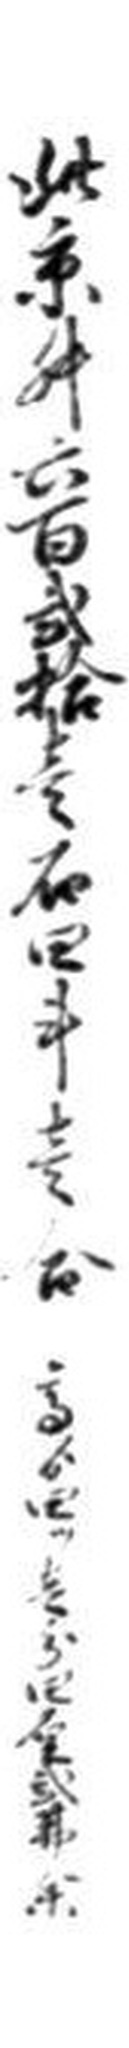此京升六百弐拾壱石四斗壱合高ゟ四ツ壱分四厘弐弗余
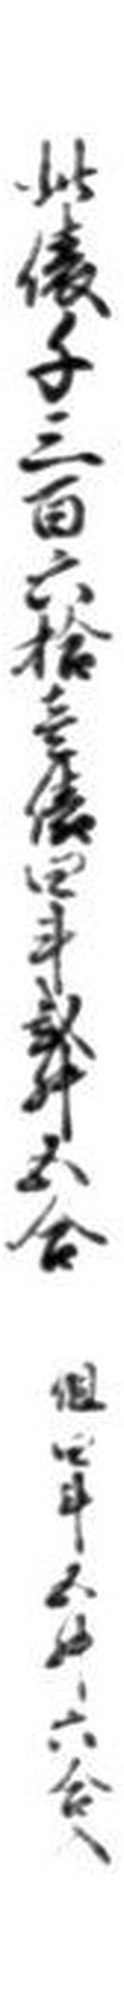此俵千三百六拾壱俵四斗弐升五合但四斗五升六合入
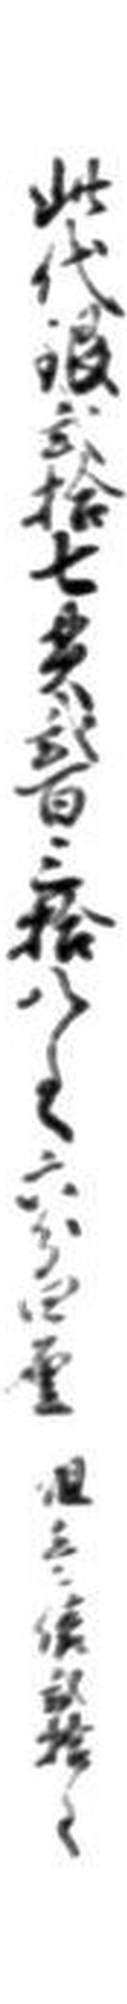此代銀弐拾七貫弐百三拾八匁六分四厘但壱俵弐拾匁
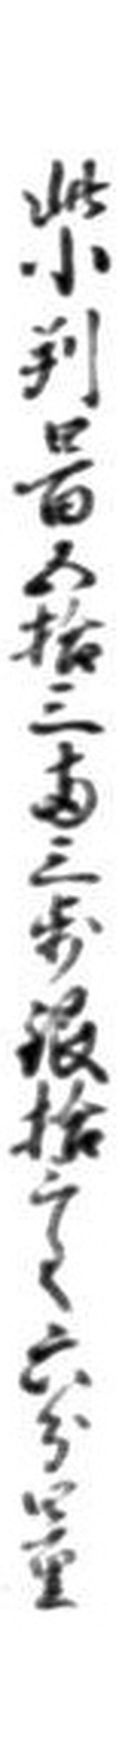此小判口百五拾三両三歩銀拾二匁六分四厘
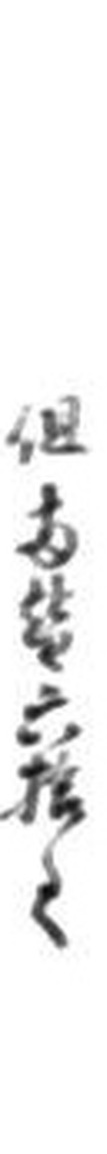但両替六拾匁
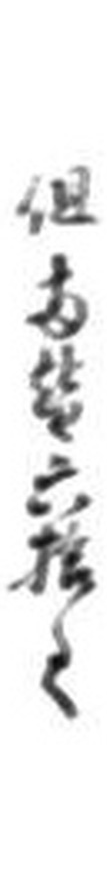但両替六拾匁
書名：家譜 三十九 宗矩公 享保十年
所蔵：福井県文書館 Fukui Prefectural Archives
